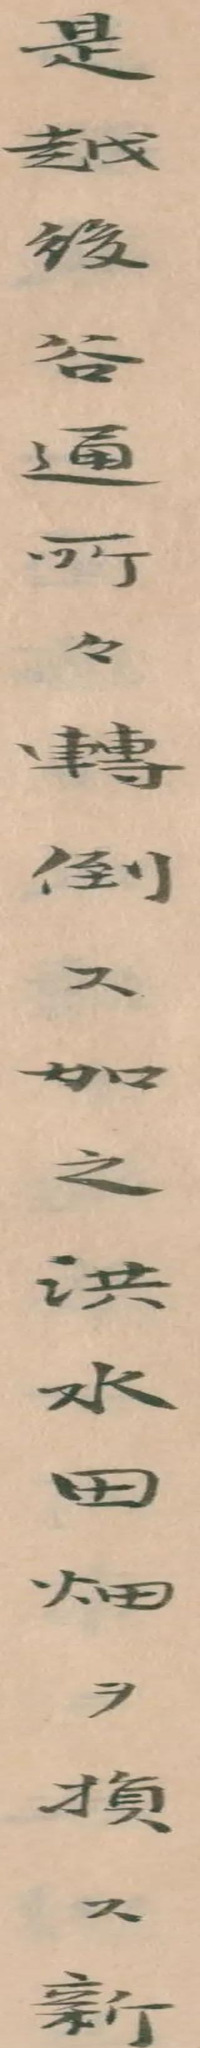是越後谷通行所々転倒ス如之洪水田畑ヲ損ス新
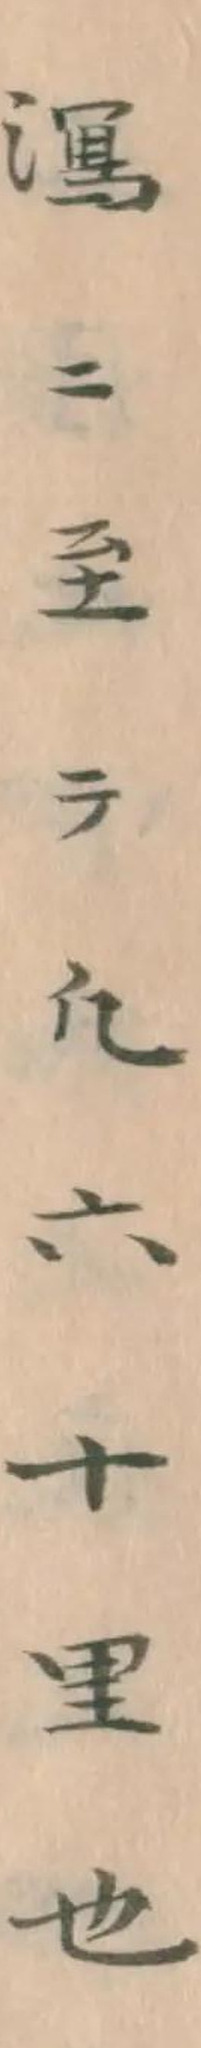潟ニ至テ凡六十里也

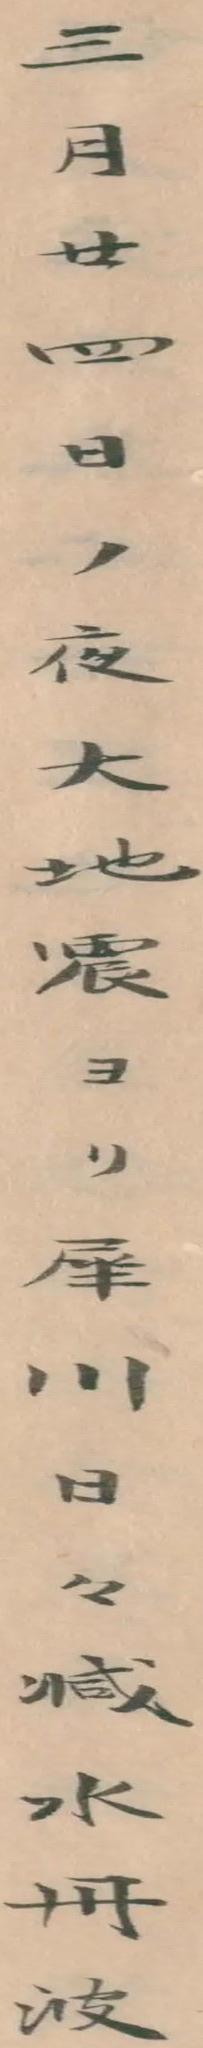三月廿四日ノ夜大地震ヨリ犀川日々減水丹波
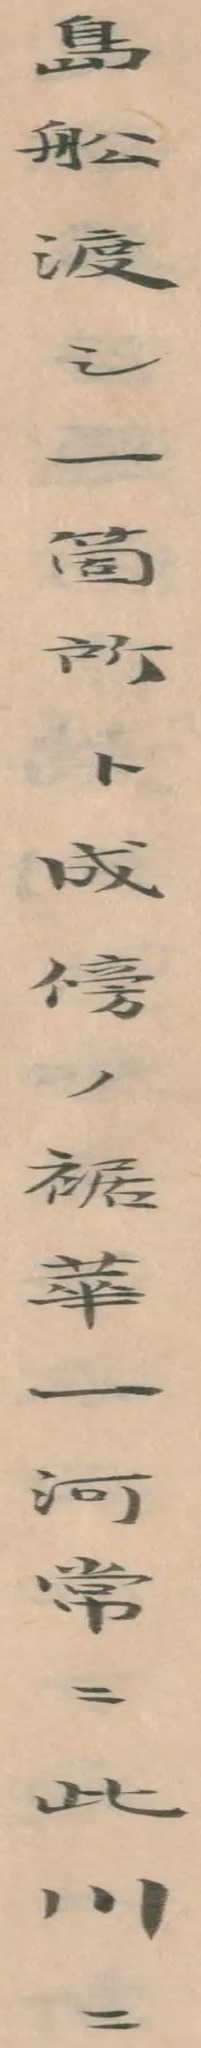島船渡シ一箇所ト成傍ノ裾華一河常ニ此川ニ
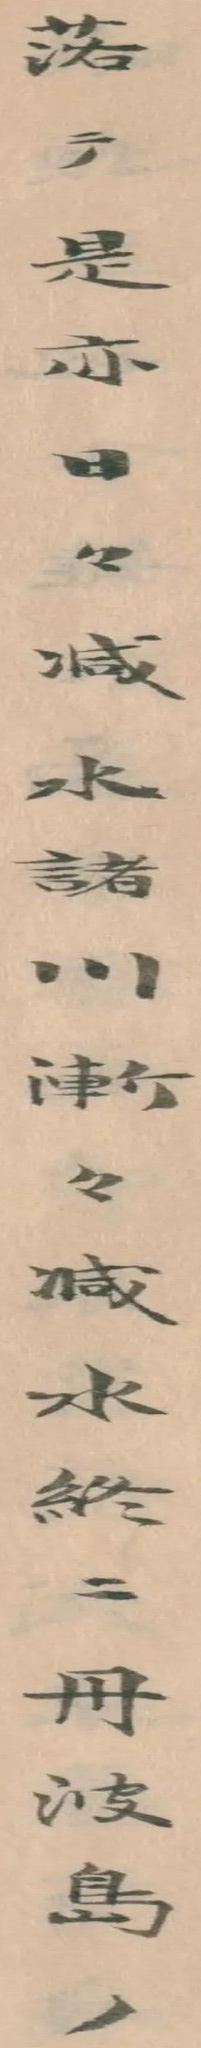落テ是亦日々減水諸川漸々減水終ニ丹波島ノ
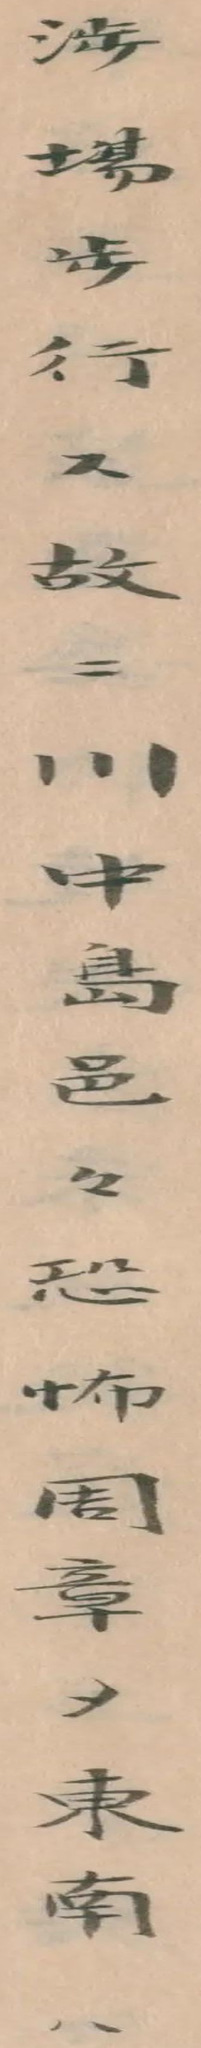渉場歩行ス故ニ川中島邑々恐怖周章シテ東南ハ
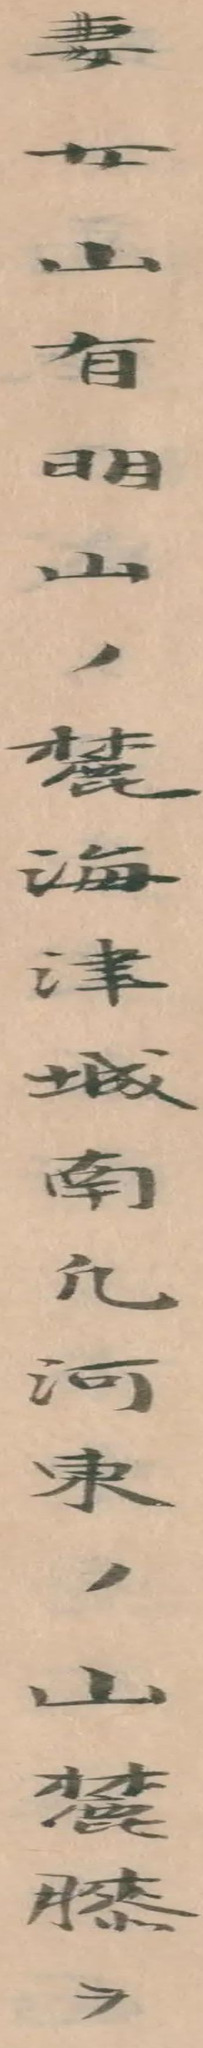妻女山有明山ノ麓海津城南凡河東ノ山麓膝ヲ
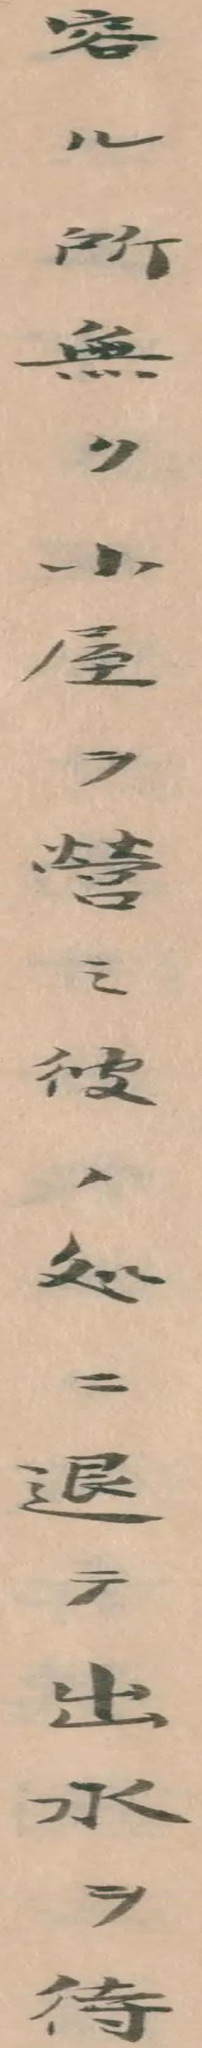容ル所無ク小屋ヲ営ミ彼ノ処ニ退テ出水ヲ待
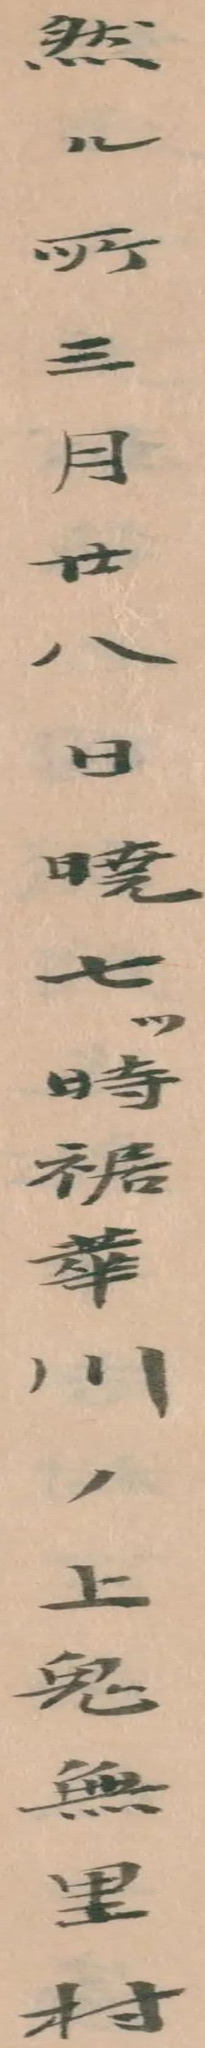然ル所三月廿八日暁七ツ時裾華川ノ上鬼無里村
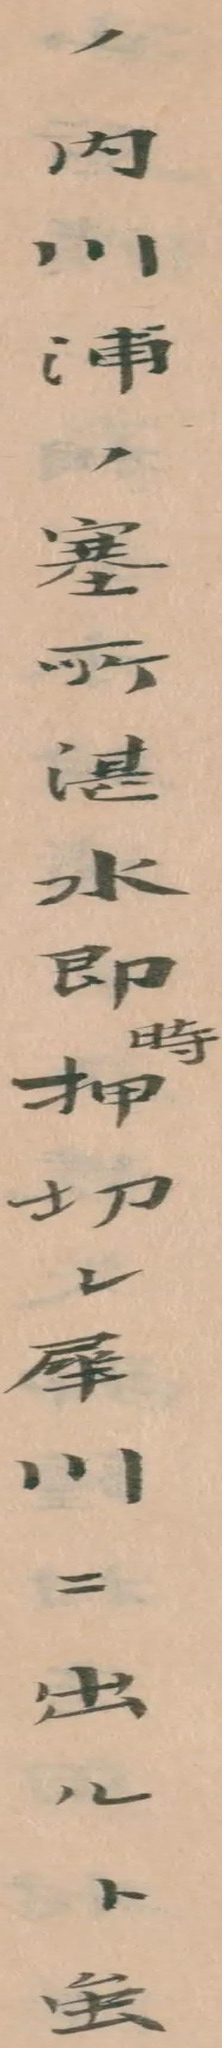ノ内川浦ノ塞所湛水即時押切レ犀川ニ出ルト雖
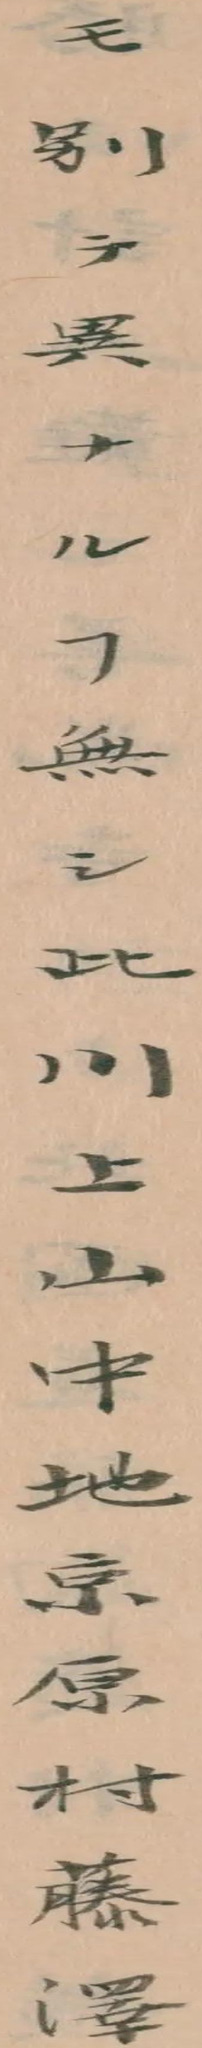モ別テ異ナルコト無シ此川上山中地京原村藤沢
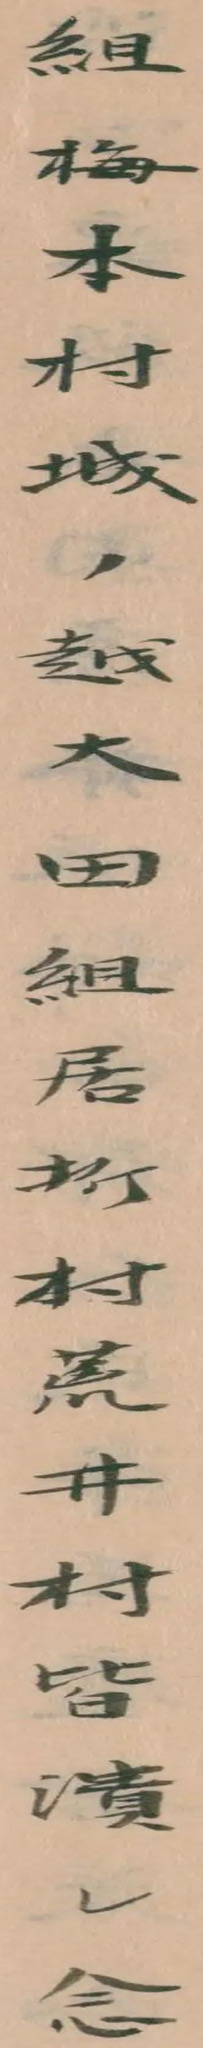組梅本村城ノ越大田組居折村荒井村皆潰レ念
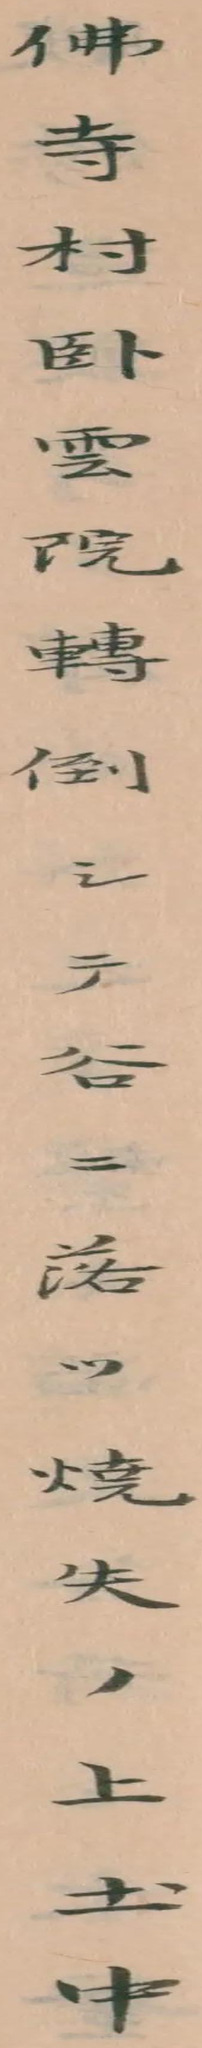仏寺村臥雲院転倒シテ谷ニ落ツ焼失ノ上土中
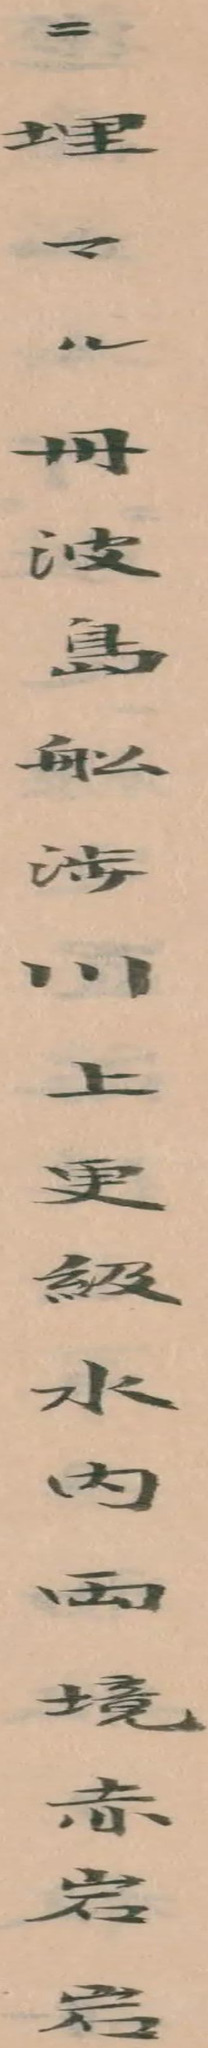ニ埋マル丹波島船渉川上更級水内両境赤岩岩
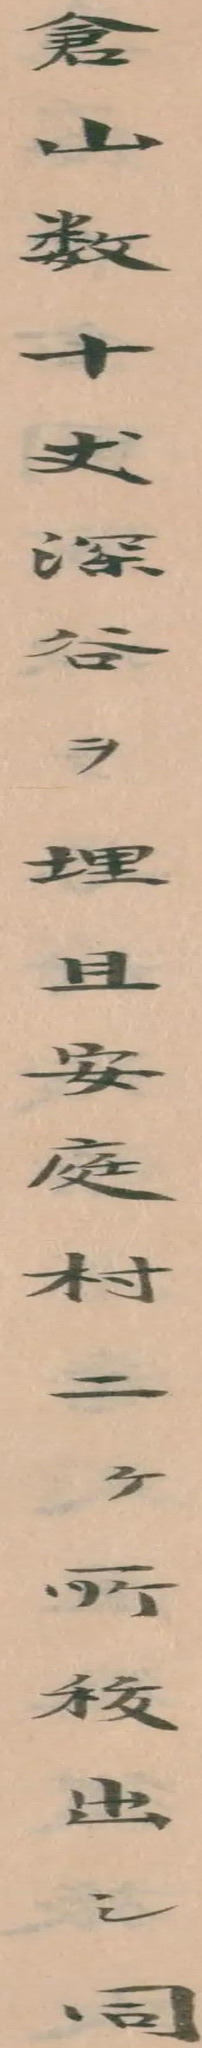倉山数十丈深谷ヲ埋且安庭村二ヶ所抜出シ同
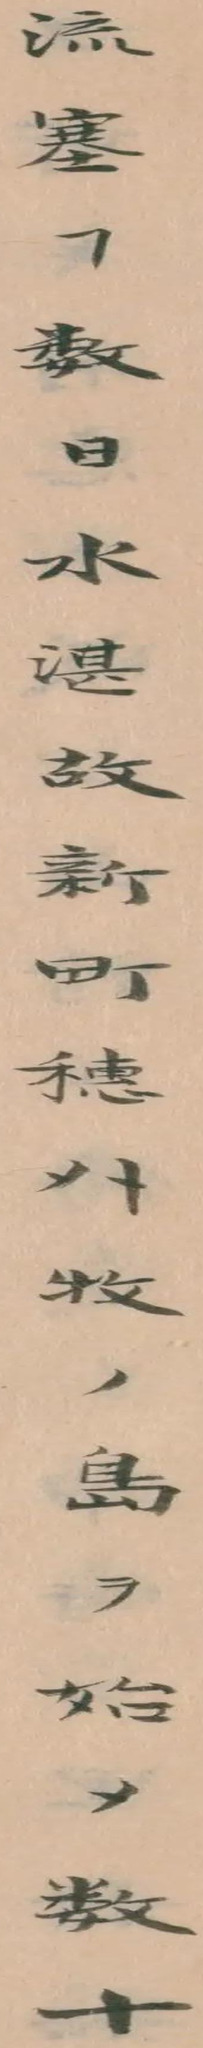流塞コト数日水湛故新町穂刈牧ノ島ヲ始メ数十
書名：地災撮要. 巻5-6(地震之部)
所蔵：国立国会図書館 National Diet Library, JAPAN
